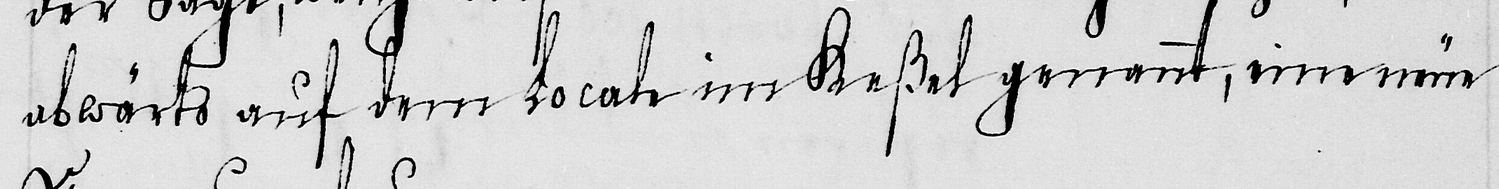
abwärts auf dem Locale im Keßel genannt, eine neue
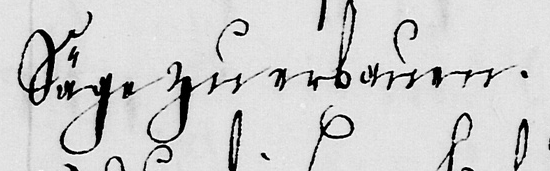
Säge zu erbauen.
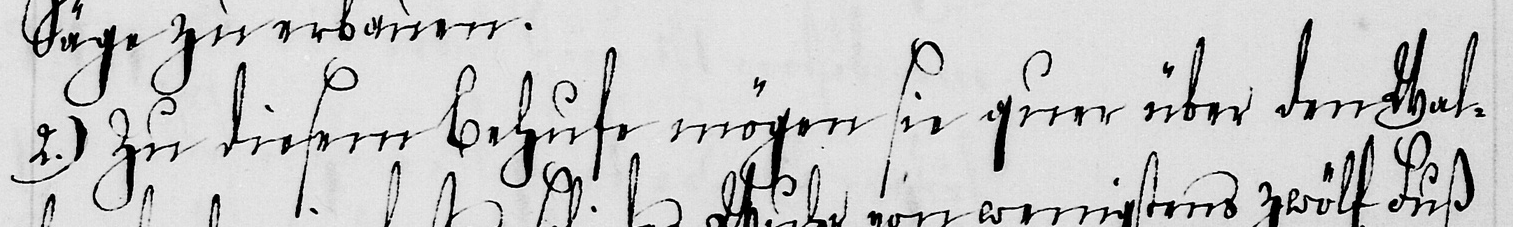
2.) Zu diesem Behufe mögen sie quer über den Wal¬
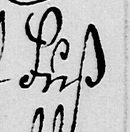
Fuß
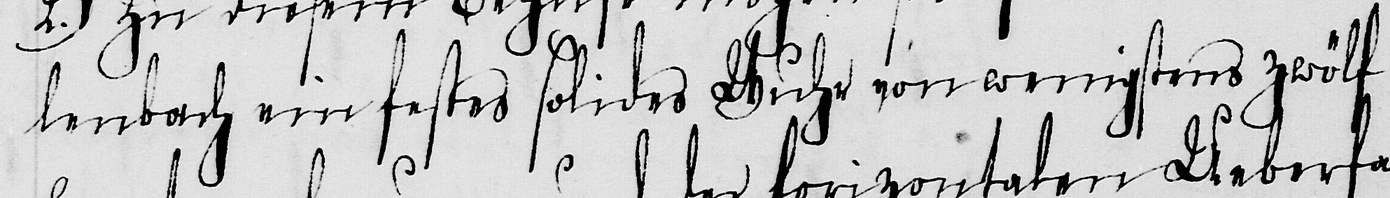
lenbach ein festes solides Wuhr von wenigstens zwölf
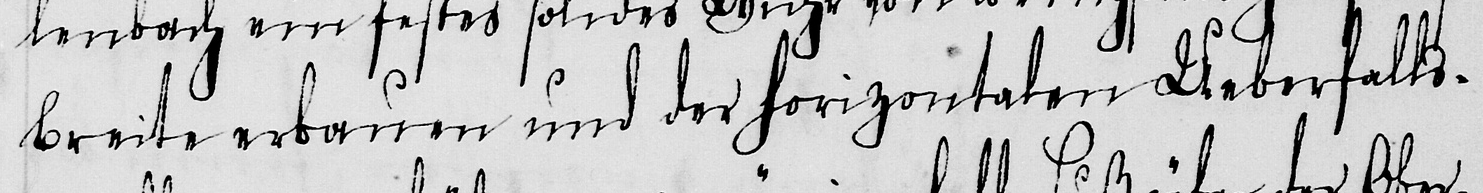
Breite erbauen und der horizontalen Ueberfalls¬
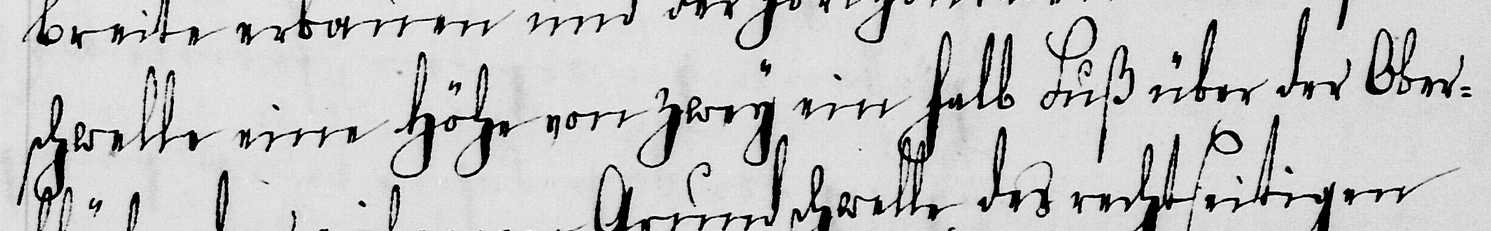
schwelle eine Höhe von zwey ein halb Fuß über der Ober¬
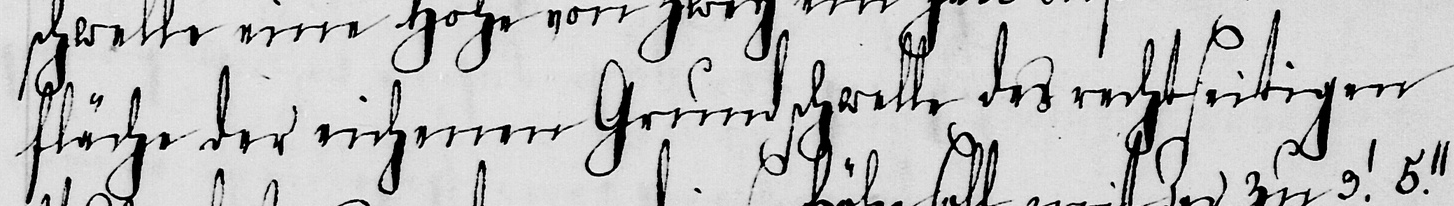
fläche der eichenen Grundschwelle des rechtseitigen
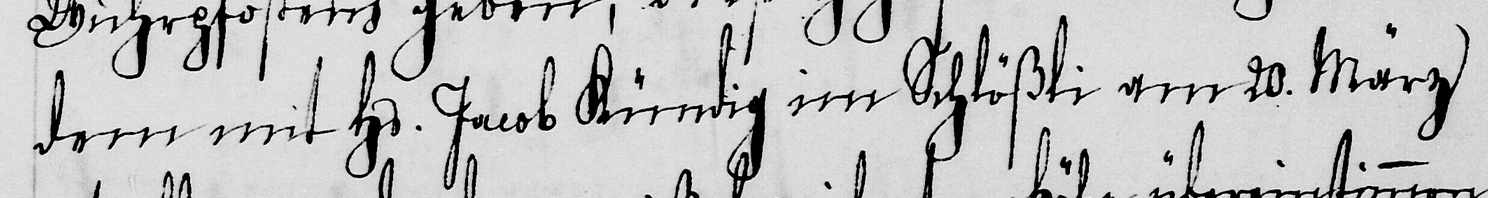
dem mit Hs. Jacob Kündig im Schlößli am 20. März
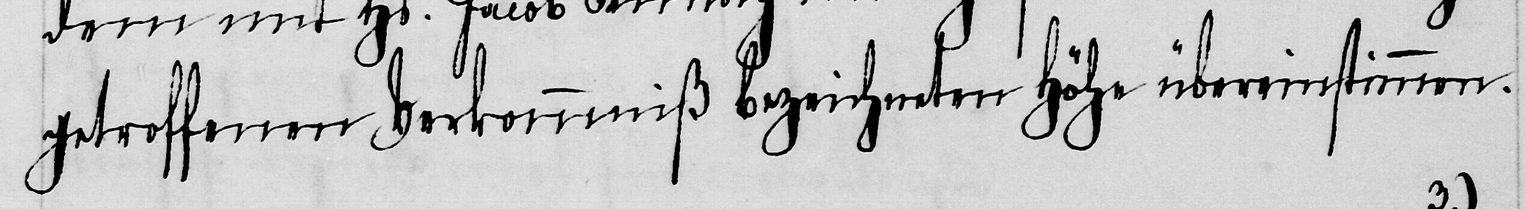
getroffenen Verkommniß bezeichneten Höhe übereinstimmen.
